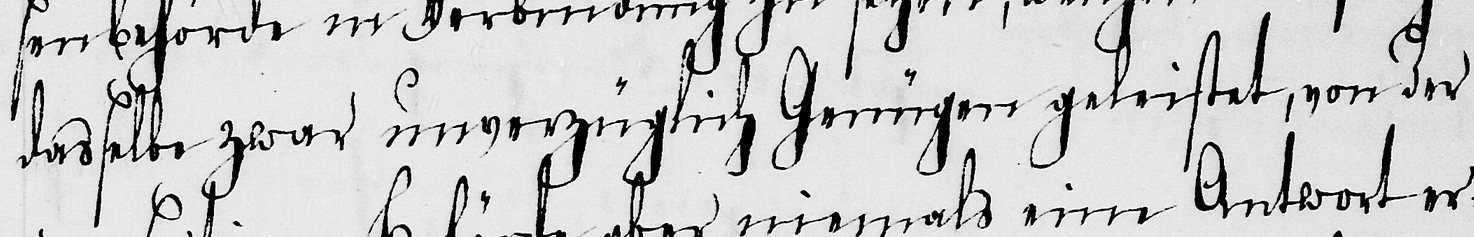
dasselbe zwar unverzüglich Genügen geleistet, von der
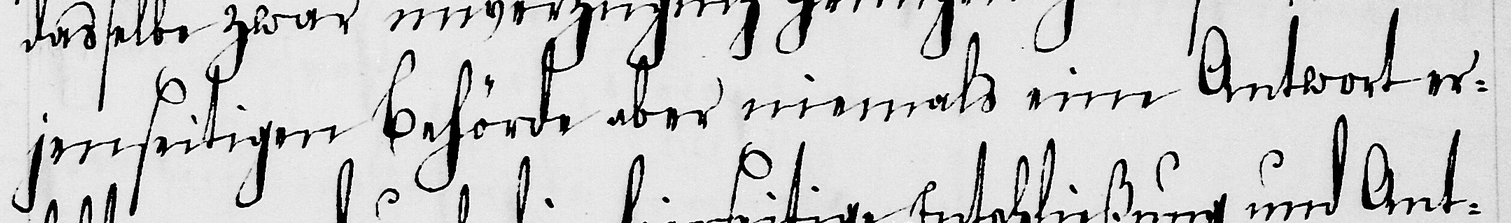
jenseitigen Behörde aber niemals eine Antwort er¬
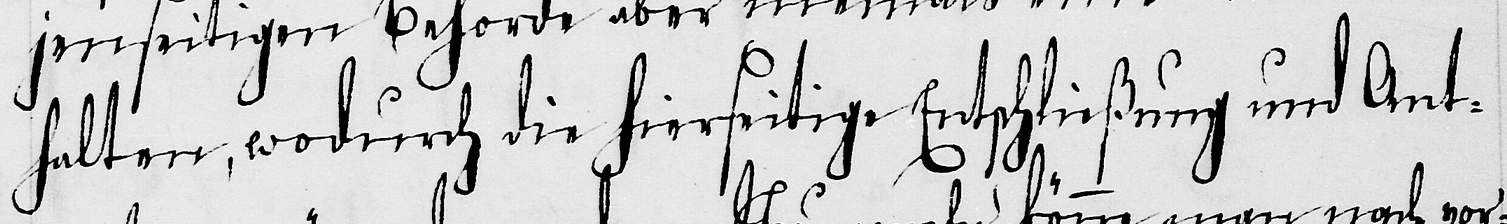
halten, wodurch die hierseitige Entschließung und Ant¬
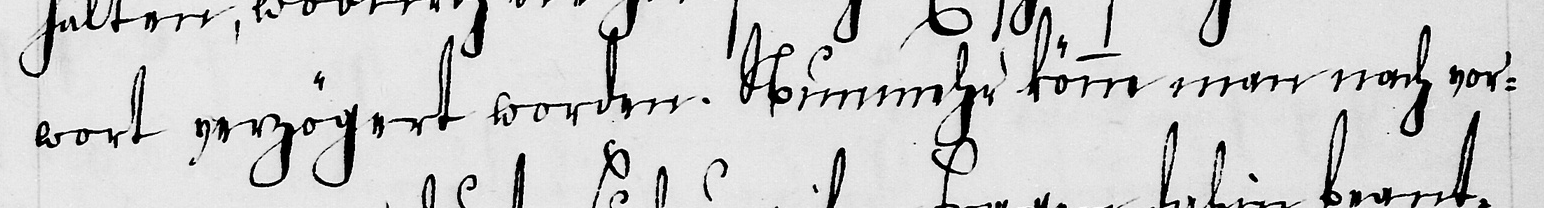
wort verzögert worden. Nunmehr könne man nach vor¬
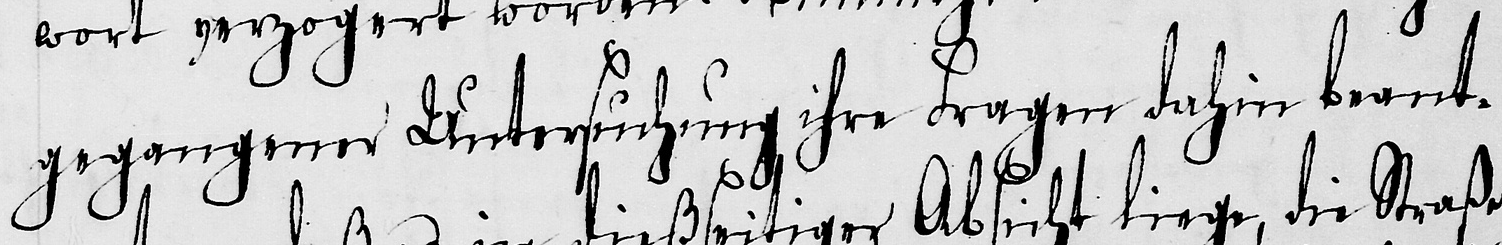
gegangener Untersuchung ihre Fragen dahin beant¬
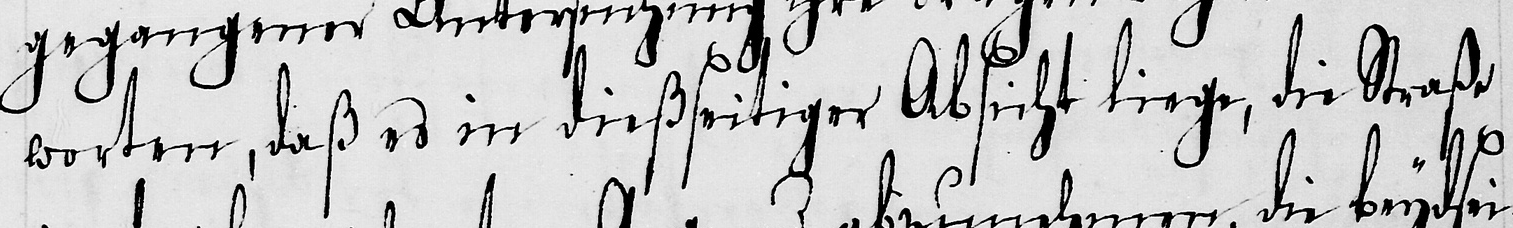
worten, daß es in dießseitiger Absicht liege, die Straße
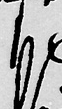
M.
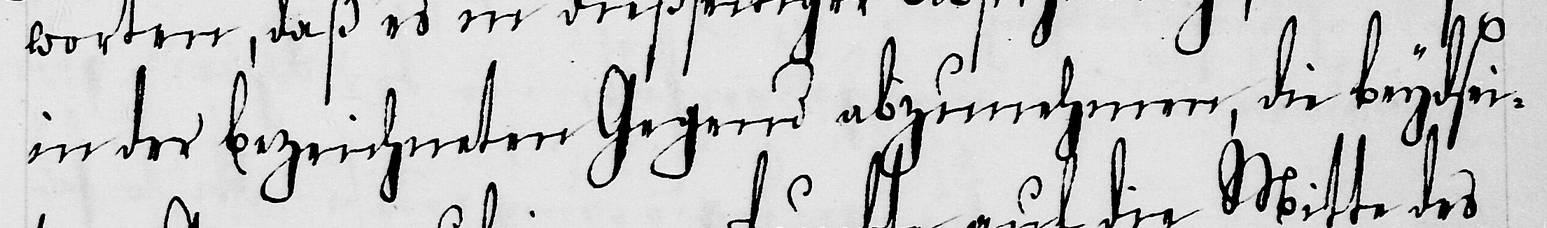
in der bezeichneten Gegend abzunehmen, die beydsei¬
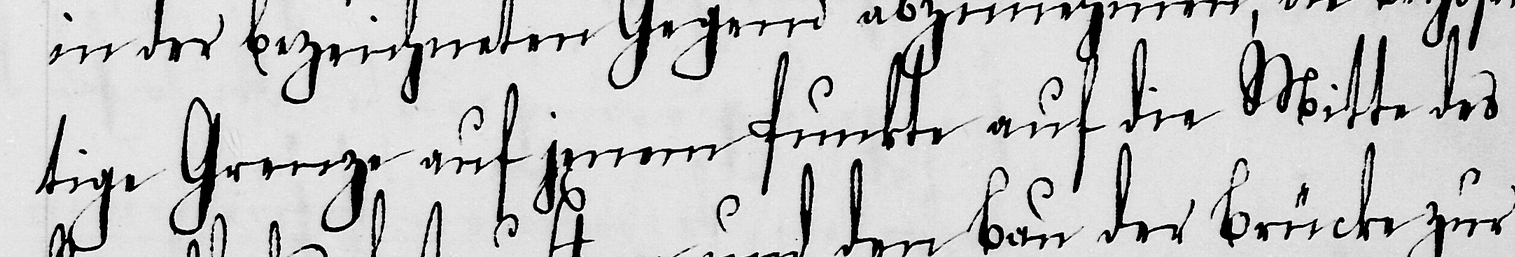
tige Grenze auf jenem Punkte auf die Mitte des
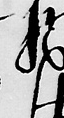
d.
